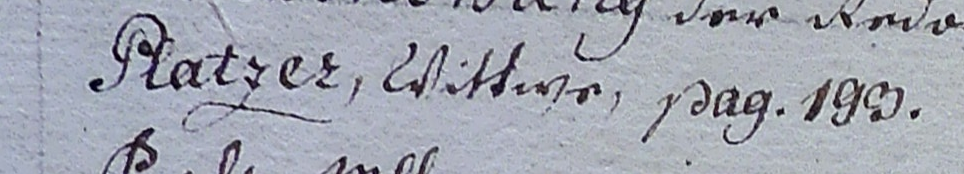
Platzer, Wittwe, pag. 193.
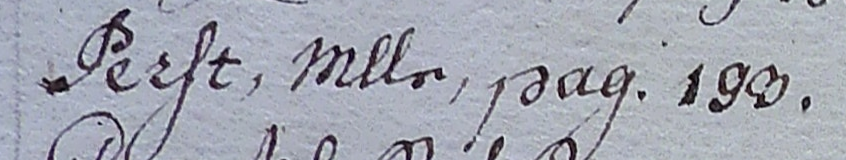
Perst, Mlle, pag. 193.
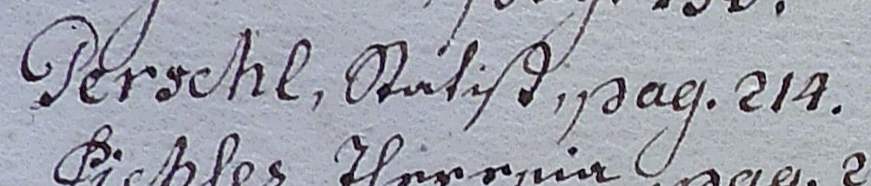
Perschl, Statist, pag. 214.
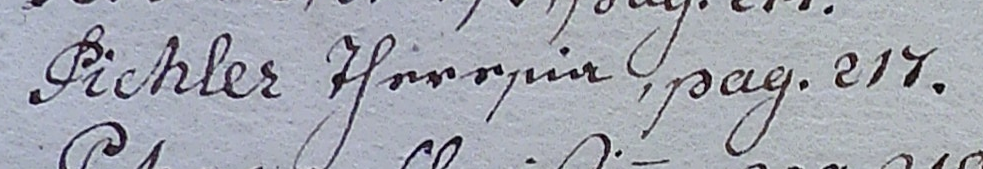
Pichler Theresia, pag. 217.
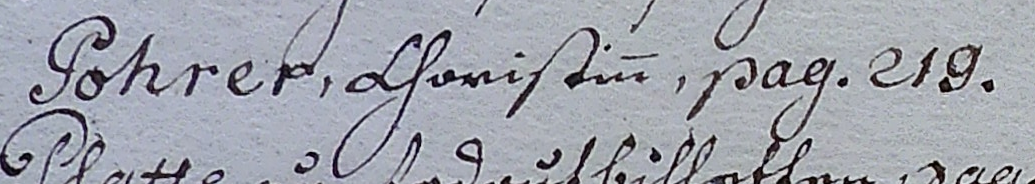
Pohrer, Choristin̅, pag. 219.
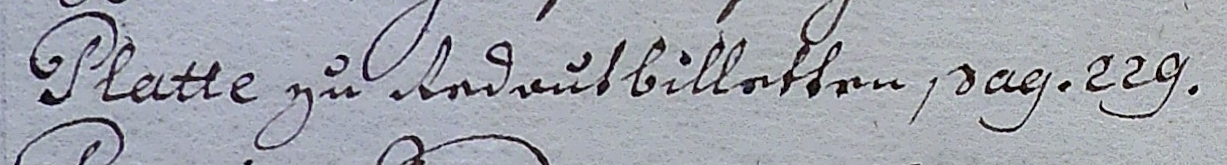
Platte zu Redoutbilletten pag. 229.
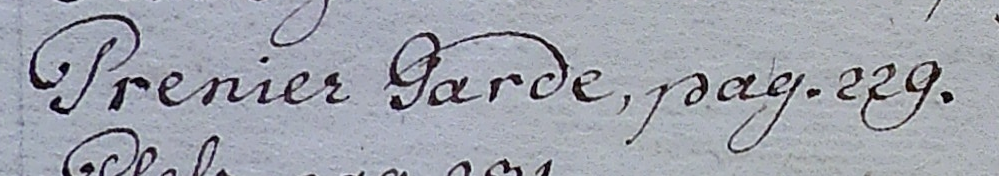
Prenier Garde, pag. 229.
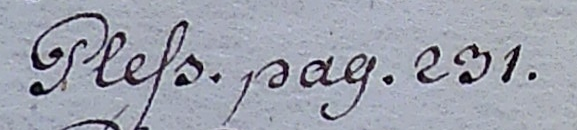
Pless. pag. 231.
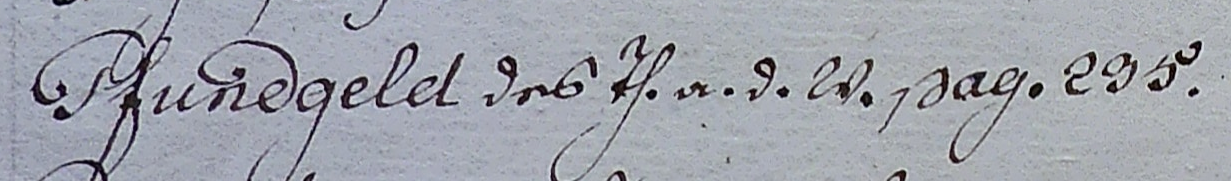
Pfundgeld des Th. a. d. W. pag. 235.
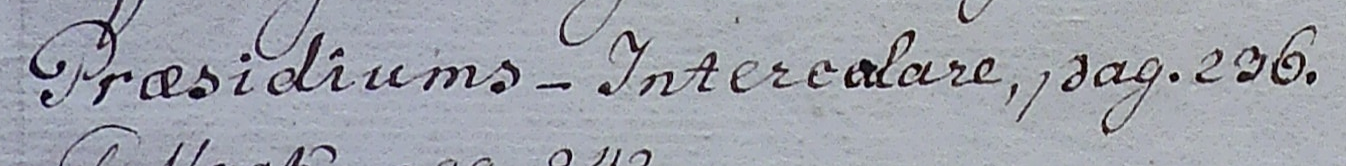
Præsidiums_Intercalare, pag. 236.
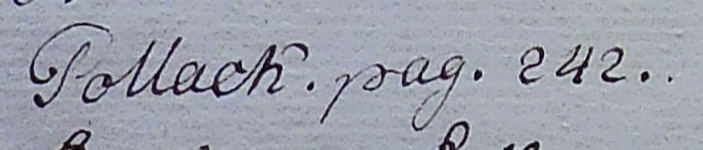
Pollack. pag. 242.
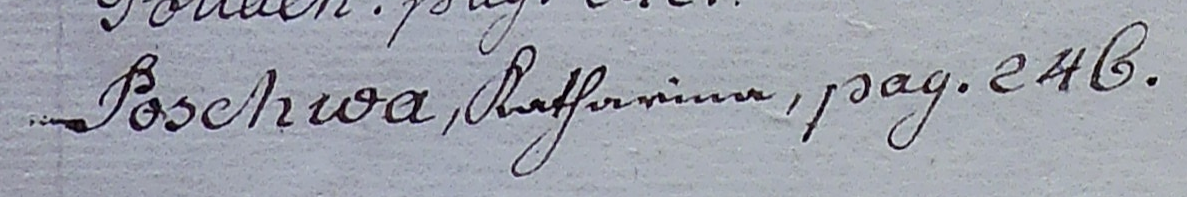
Poschwa, Katharina, pag. 246.
